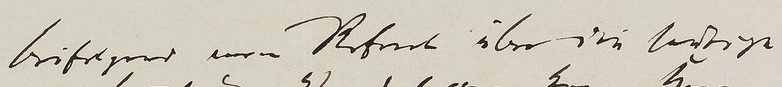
Beifolgend mein Referat über die heutige
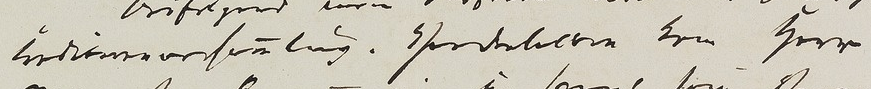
Creditorenversammlung. Vor derselben kam Herr
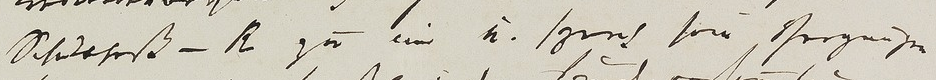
Schultheß–R zu mir u. sprach sein Vergnügen
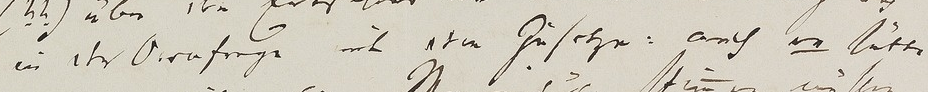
in der Oronfrage mit dem Zusatze: auch er hätte
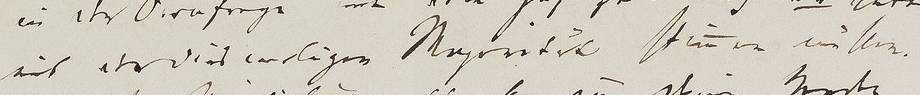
mit der diesmaligen Majorität stimmen müssen.
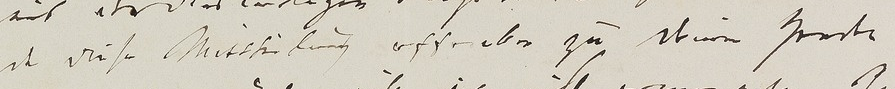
Da diese Mittheilung offenbar zu Deinen Handen
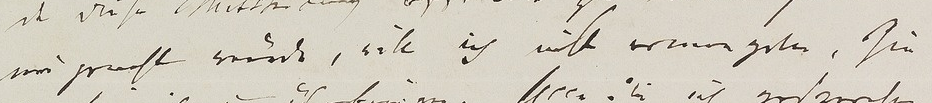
mir gemacht wurde, will ich nicht ermangeln, sie
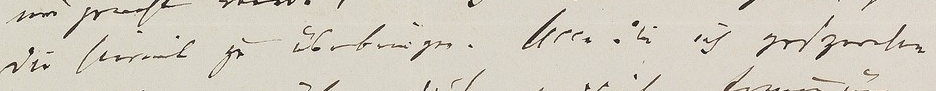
Dir hiermit zu überbringen. Alle die ich gesprochen
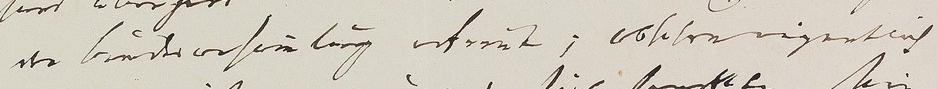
der Bundesversammlung erfreut; obschon eigentlich
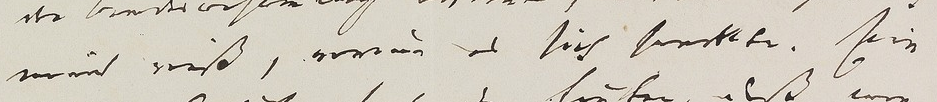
niemand weiß, worum es sich handelte. Ein
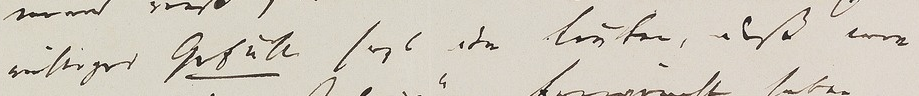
richtiges Gefühl sagt den Leuten, daß man
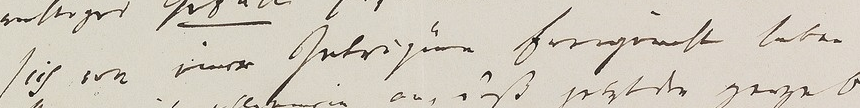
sich von einer Intrigue freigemacht habe.
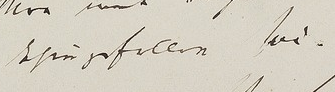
dahin gefallen sei.
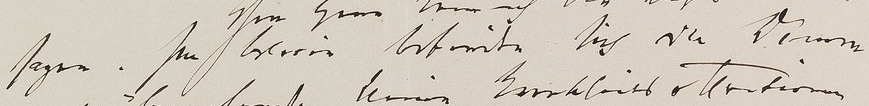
sagen. Im Belvoir befinden sich die Damen
